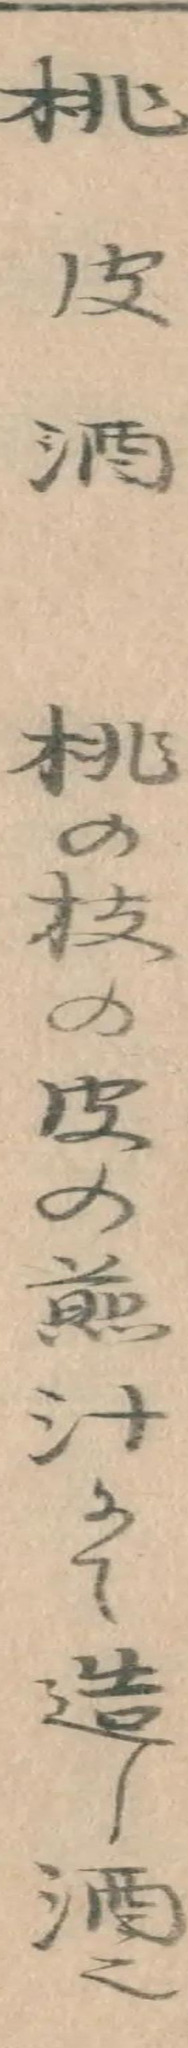桃皮酒桃の枝の皮の煎汁にて造し酒也
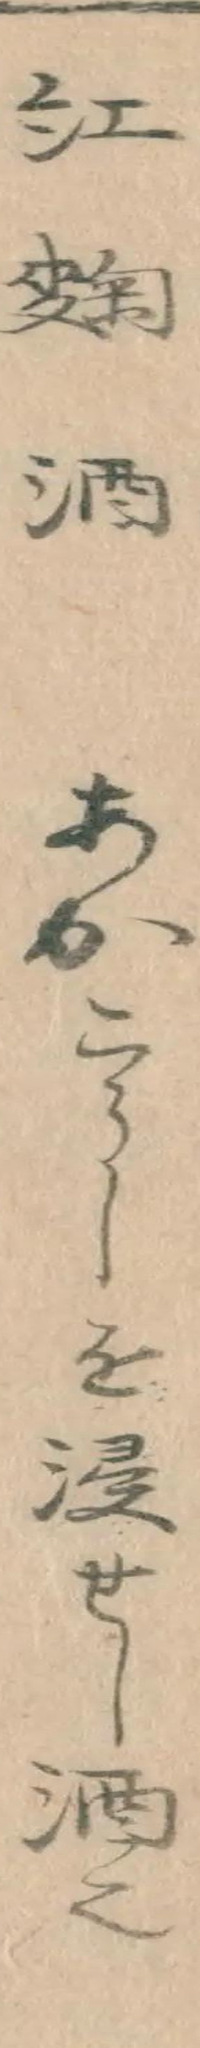紅麹酒あかこうしを浸せし酒也

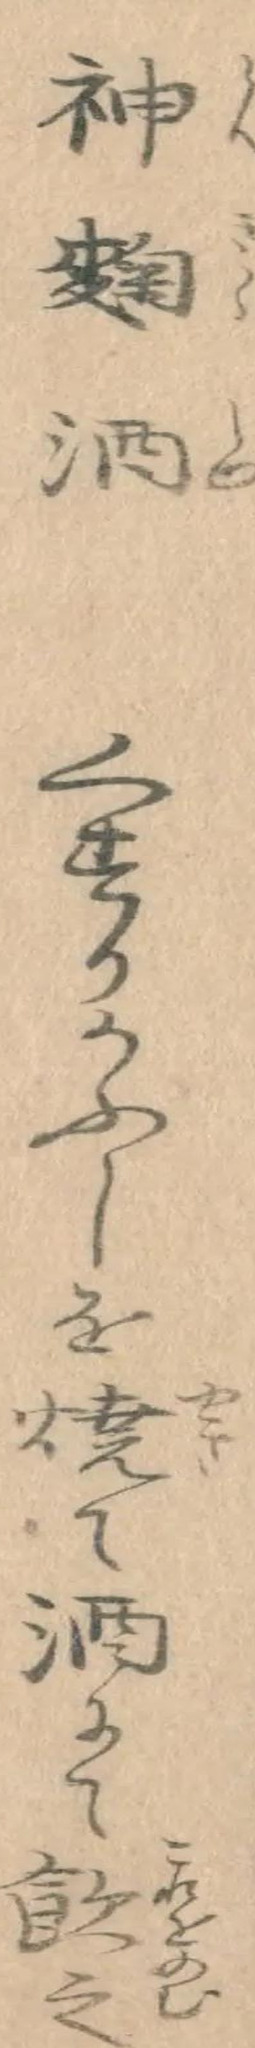神麹酒くすりかふしを焼て酒にて飲之
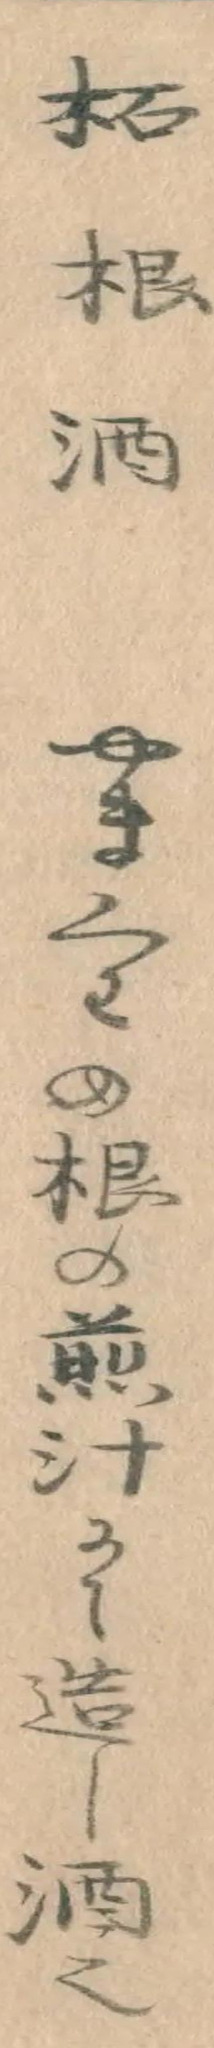柘根酒やまくわの根の煎汁にて造し酒也
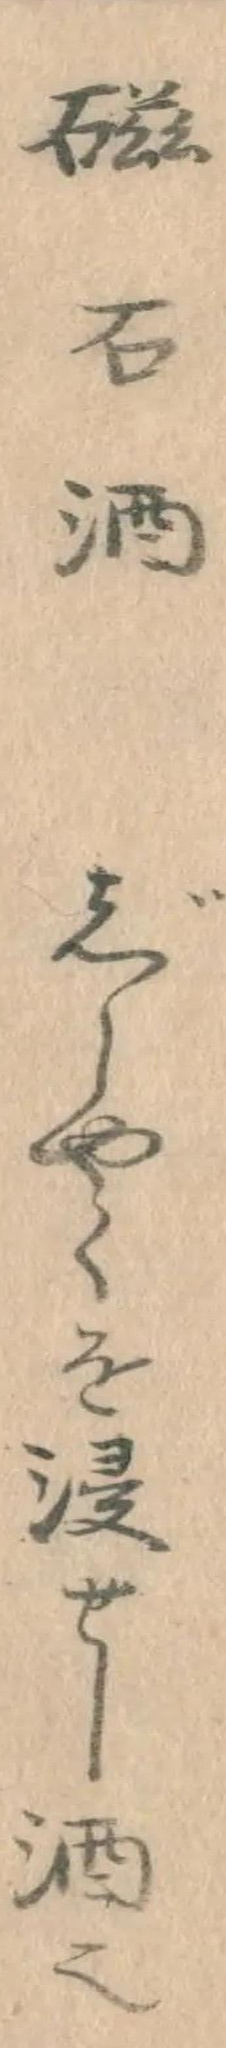磁石酒じしやくを浸せし酒也
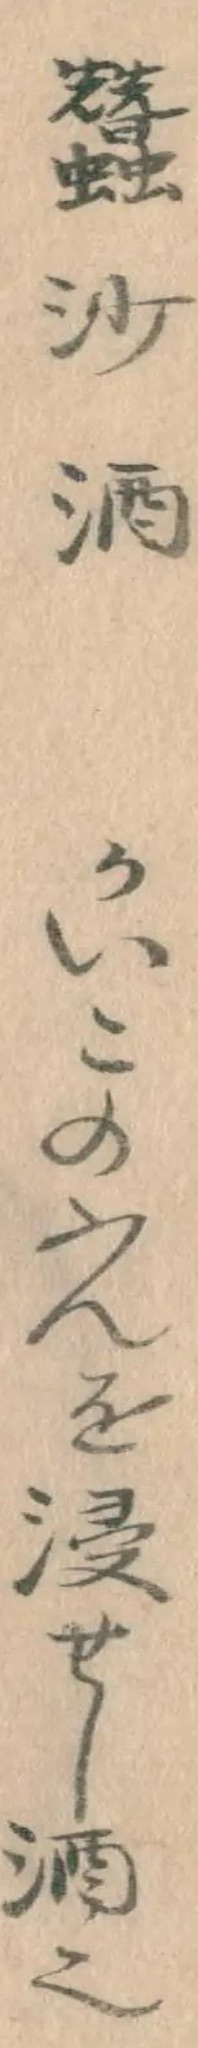蚕沙酒かいこのふんを浸せし酒也
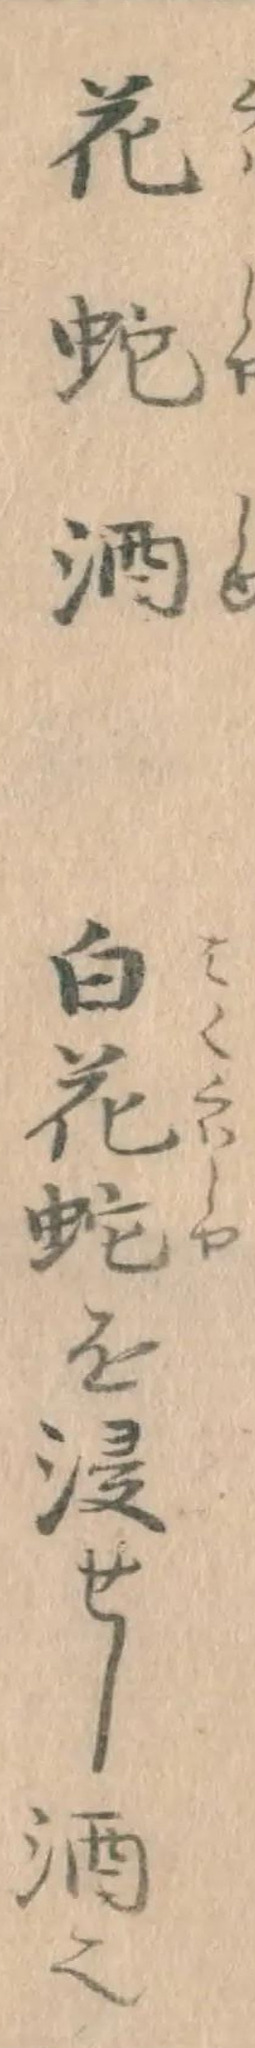蝮蛇酒まむしを浸せし酒也
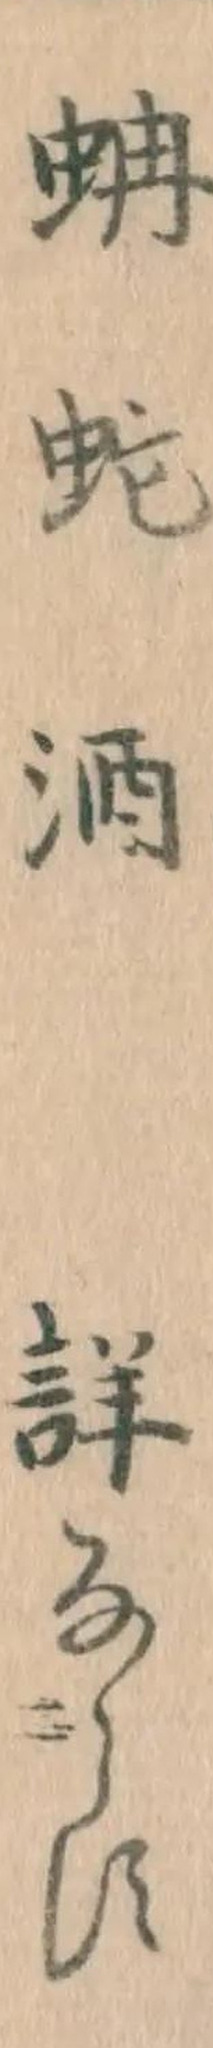蚺蛇酒詳ならす
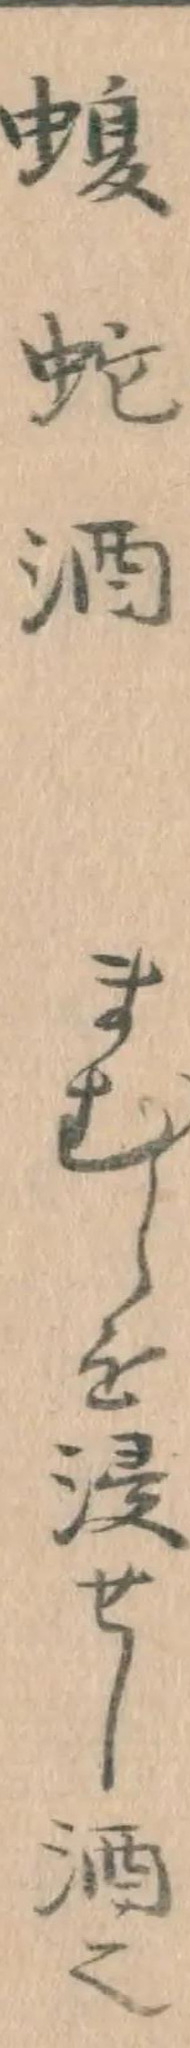蝮蛇酒まむしを浸せし酒也
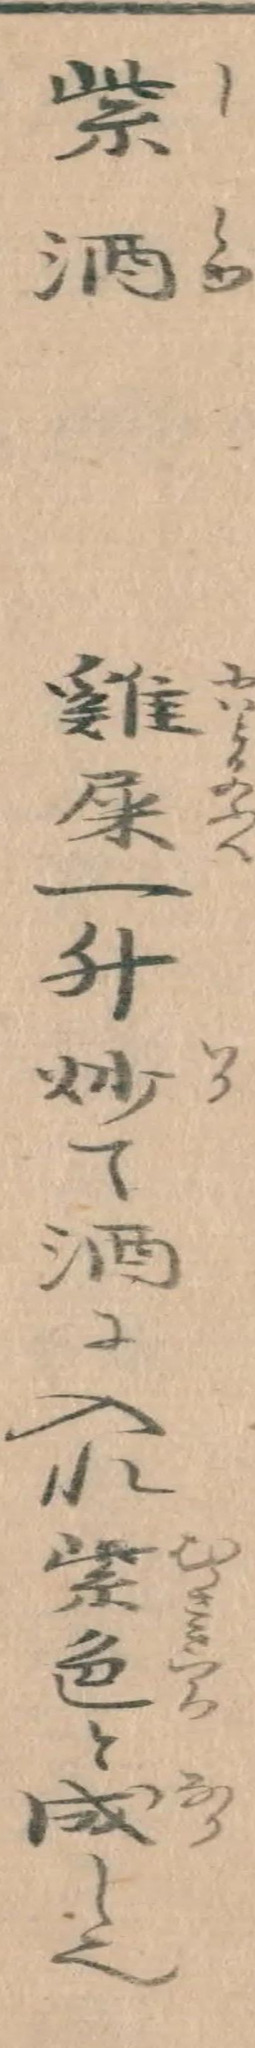紫酒鶏屎一升炒て酒に入れ紫色と成し也
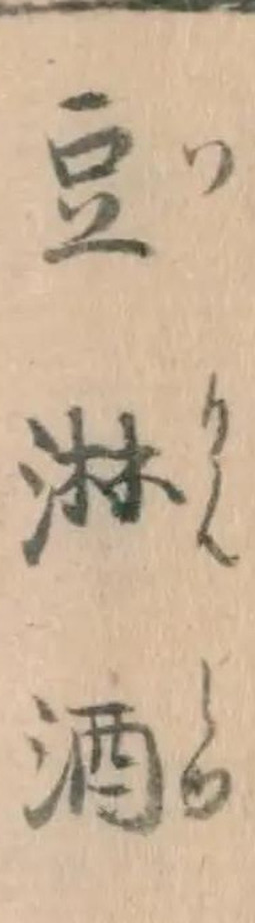豆淋酒
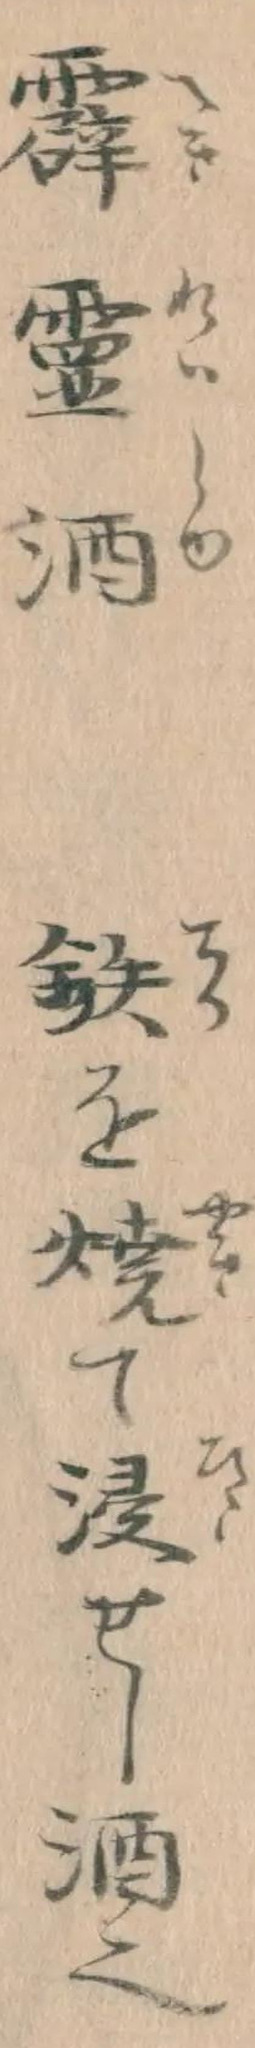霹霊酒鉄を焼て浸せし酒也
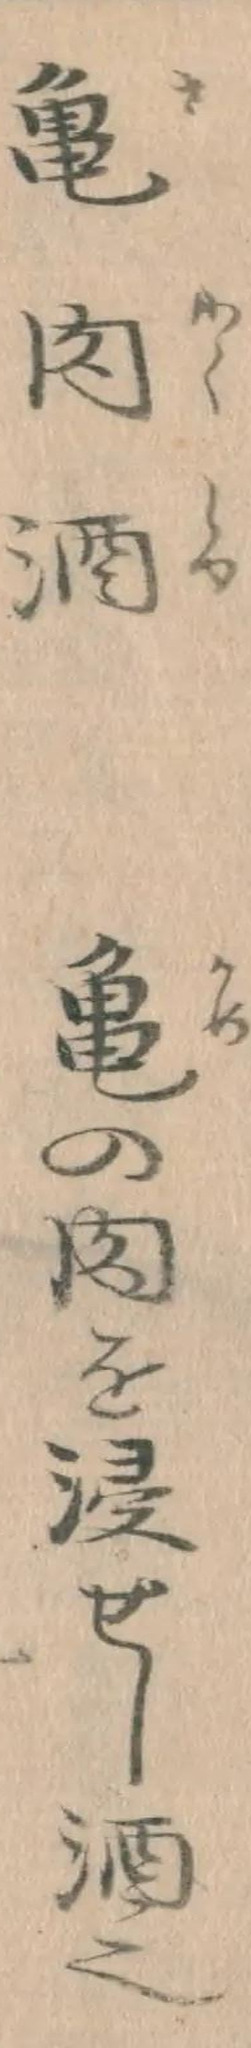亀肉酒亀の肉を浸せし酒也
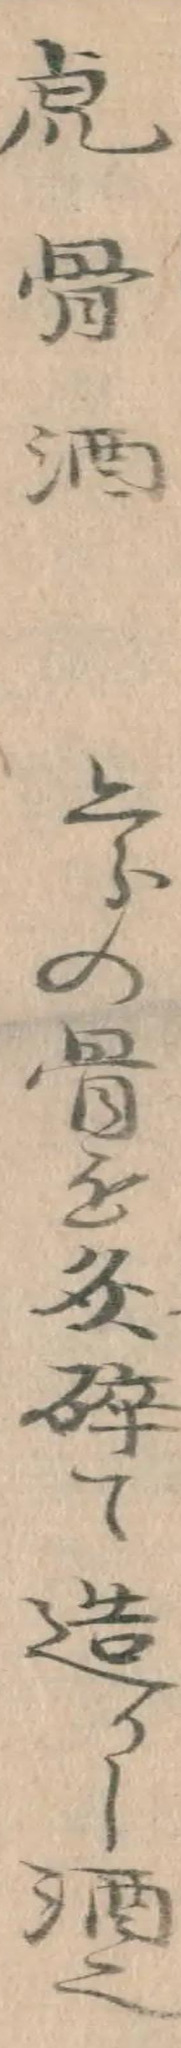虎骨酒とらの骨を灸砕て造りし酒也
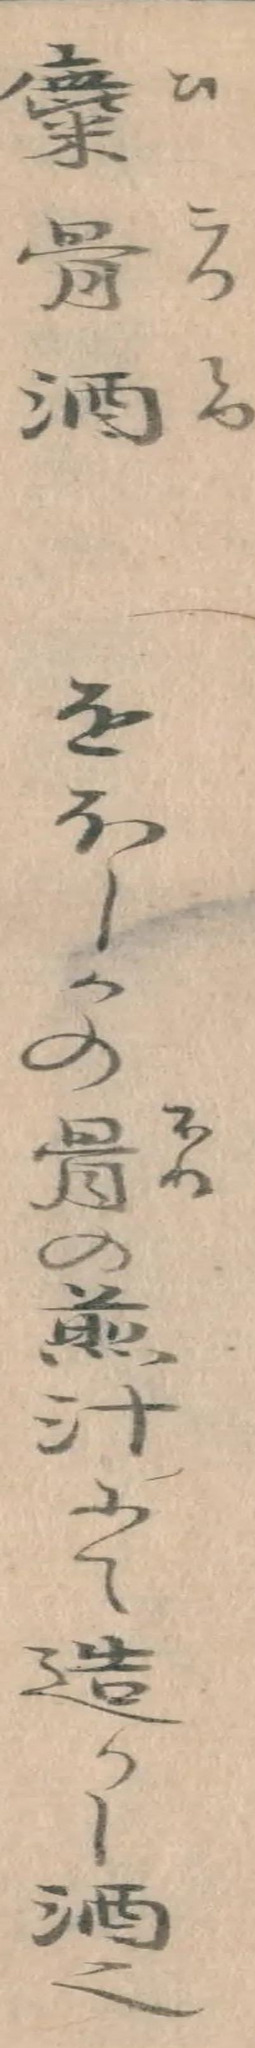麋骨酒をほしかの骨の煎汁にて造りし酒也
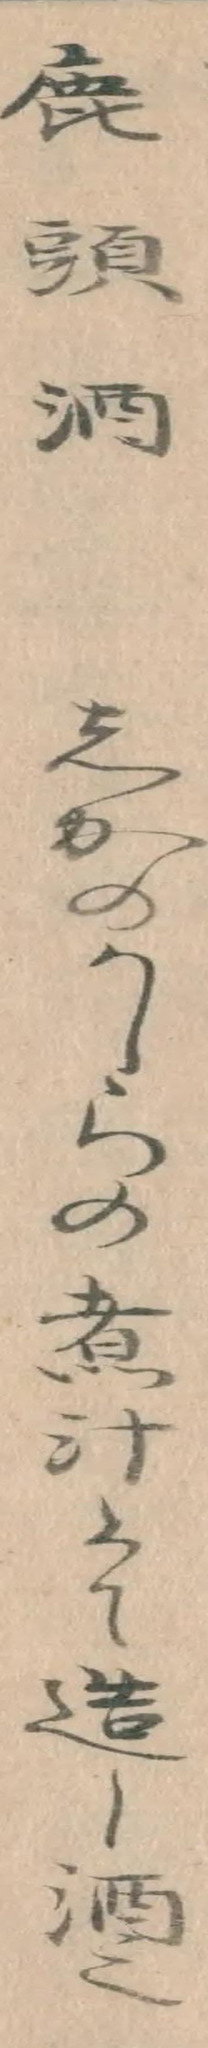鹿頭酒しかのかしらの煮汁にて造し酒也
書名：本草図譜. 巻43-45
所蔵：国立国会図書館 National Diet Library, JAPAN
